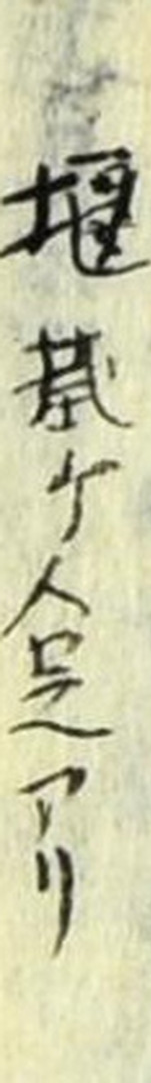堰基ヶ人足アリ
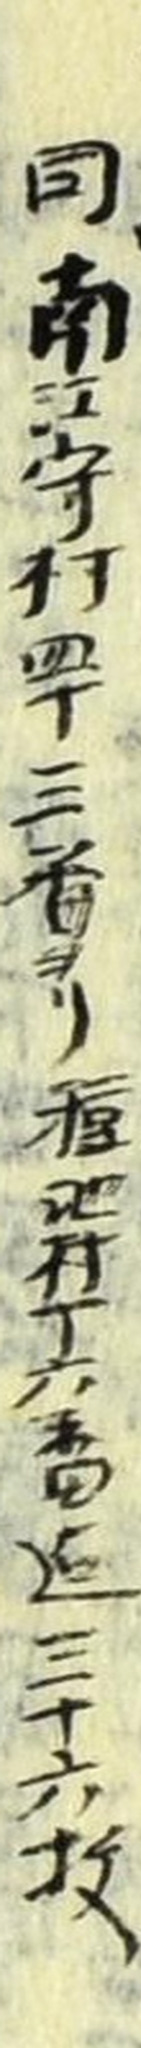同南江守村四十三番ヨリ種池村十六番迄三十六枚

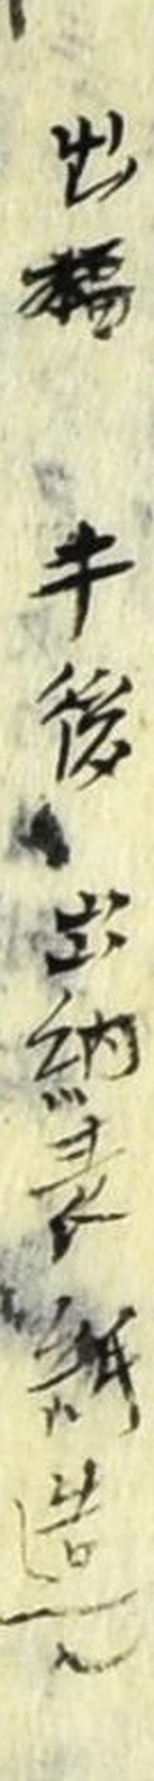出福午後出納表紙造ル

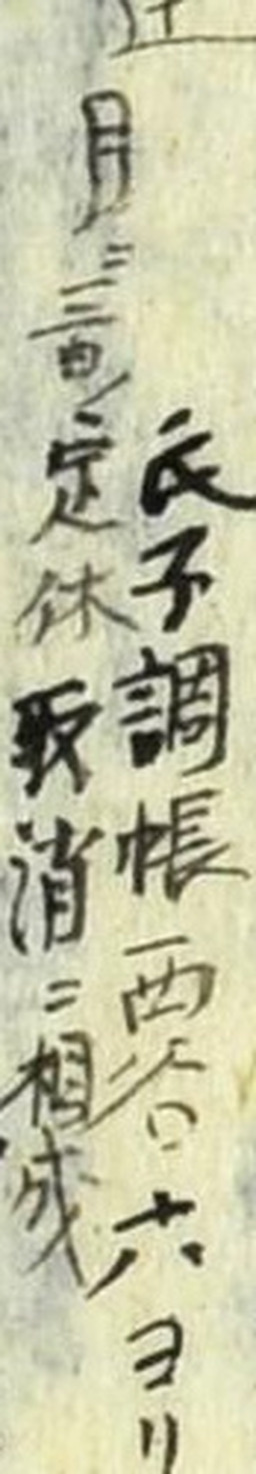月ニ三日ノ定休取消ニ相成
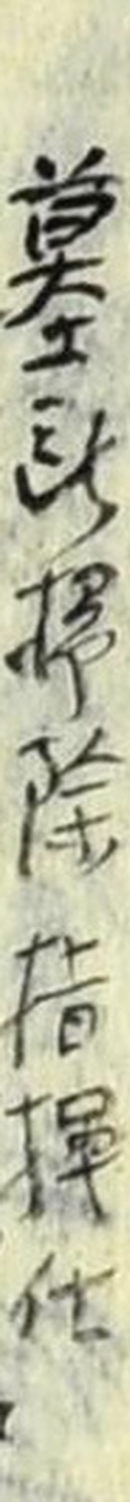墓所掃除指揮仕
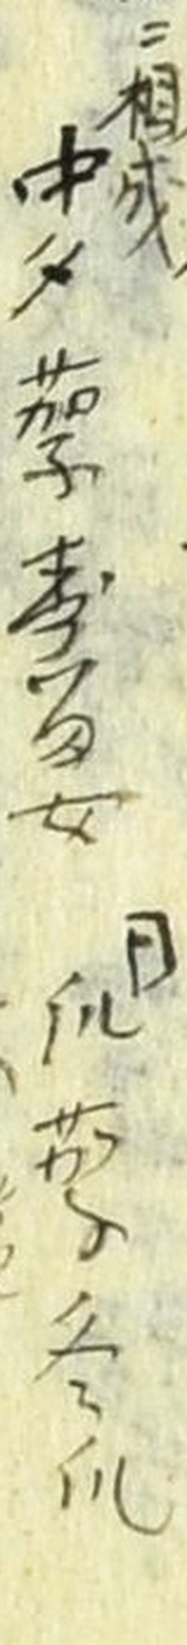二日照中夕茄子寿留女瓜茄子冬瓜
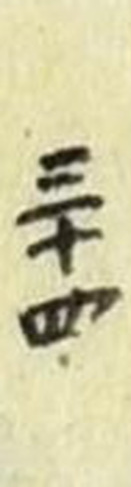三十四
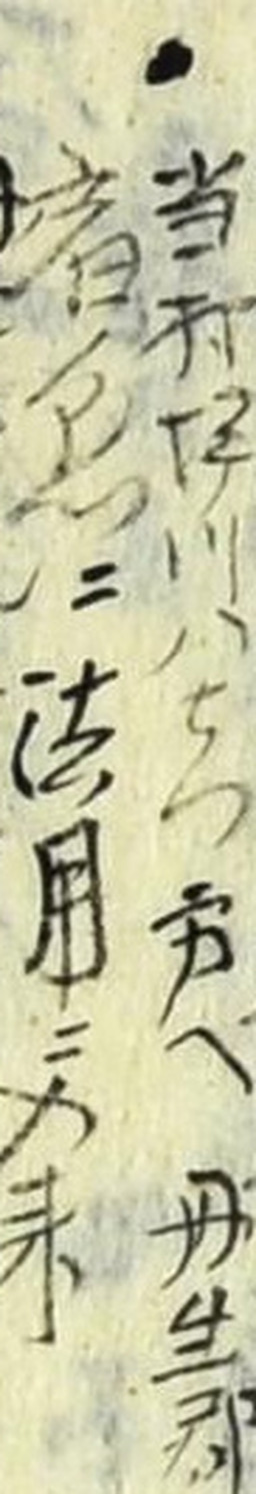宿懸ニ法用ニ入来
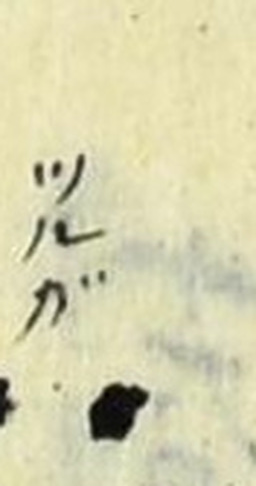ツルガ
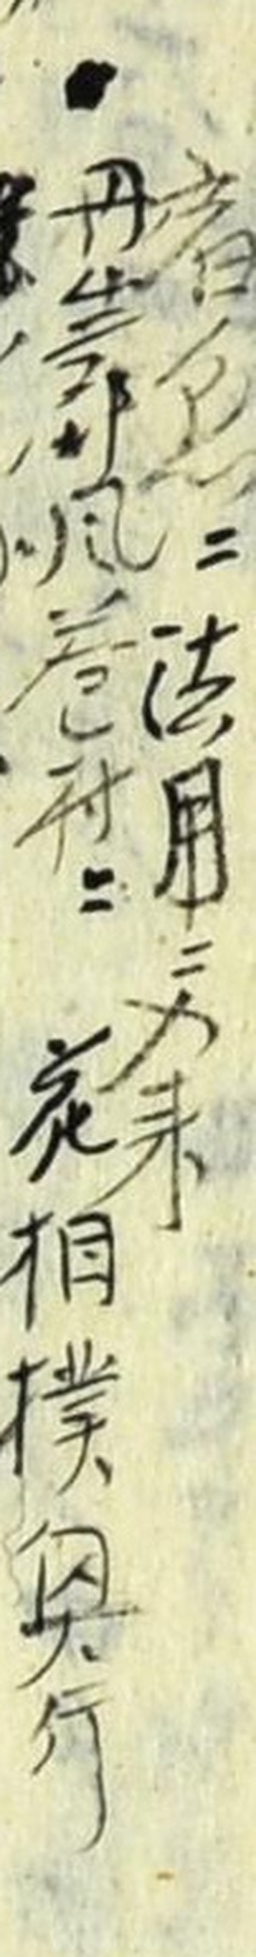●丹生郡風巻村ニ花相撲興行
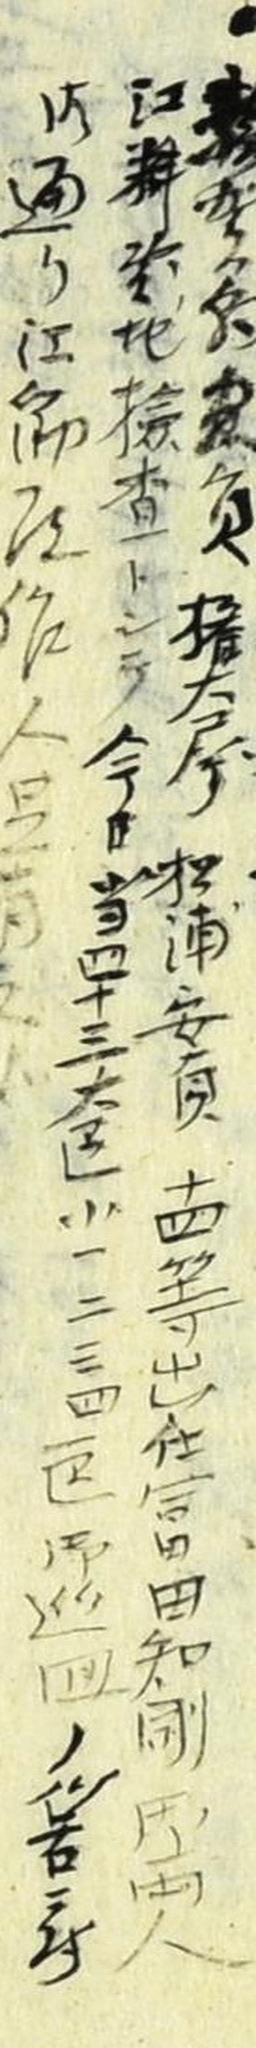江耕敷地検査トシテ今日当四十三大区小一二三四区御巡回ノ筈ニ付
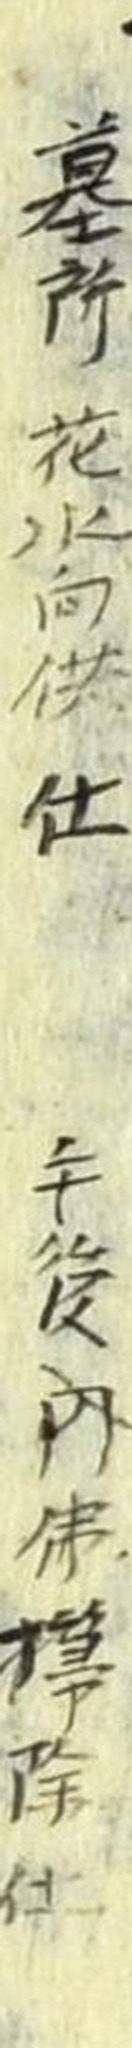墓所花水向供仕午後内仏掃除仕
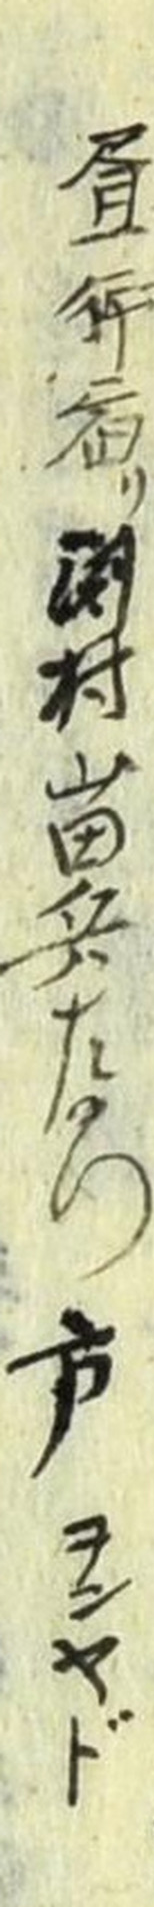昼御宿リ淵村山田兵左衛門方ヲンヤド
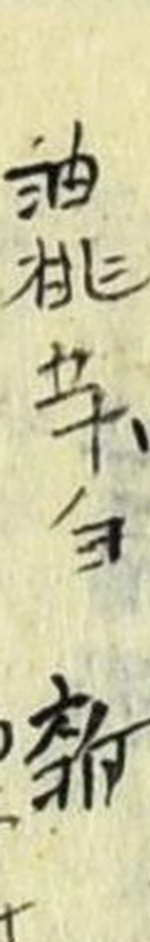「油桃五十ノヨ
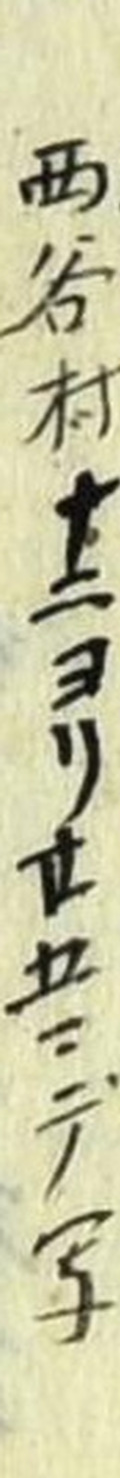西谷村十二ヨリ廿五マデ写
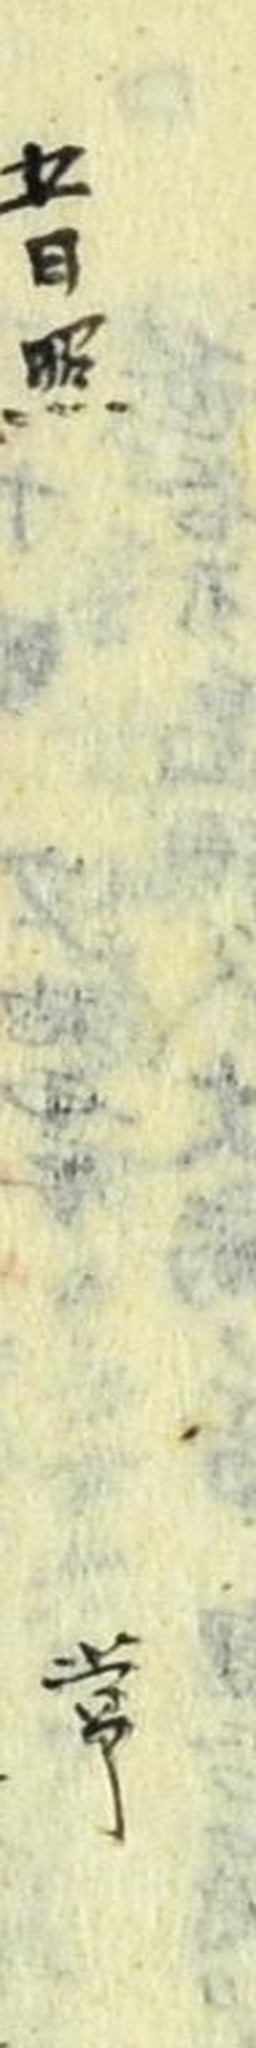五日照常
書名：（日記）
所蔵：福井県文書館 Fukui Prefectural Archives
